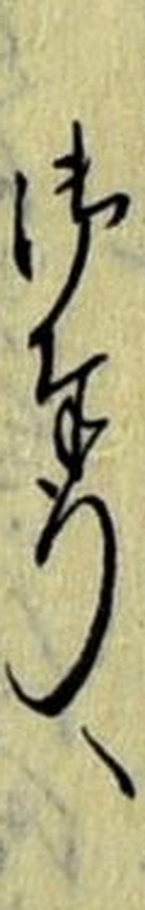御奉行へ
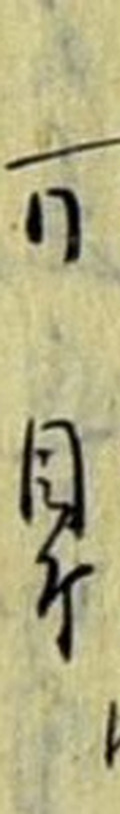御目付

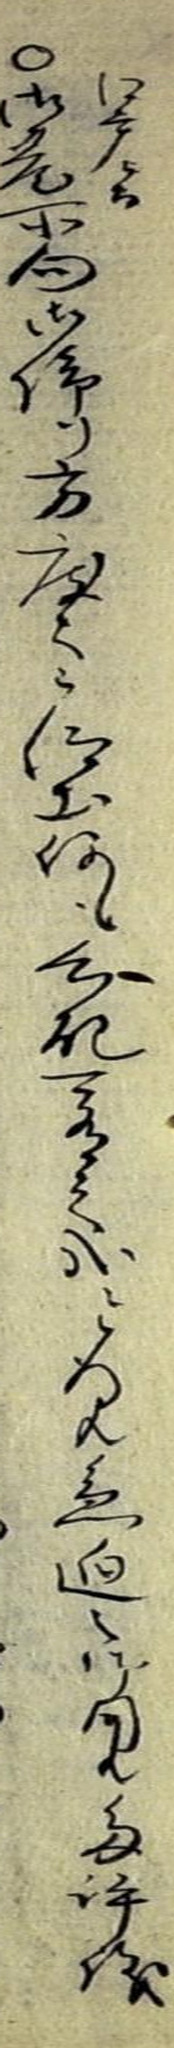○御台所向御締り方度々被仰出何も心配可有之哉に候得共急迫之御用共多評儀
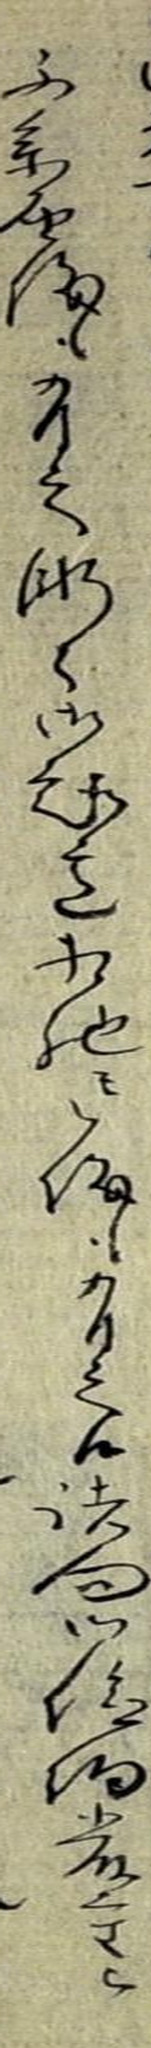不参届儀も有之漸々御趣意相弛ミ候儀も有之候諸向御倹約厳重被
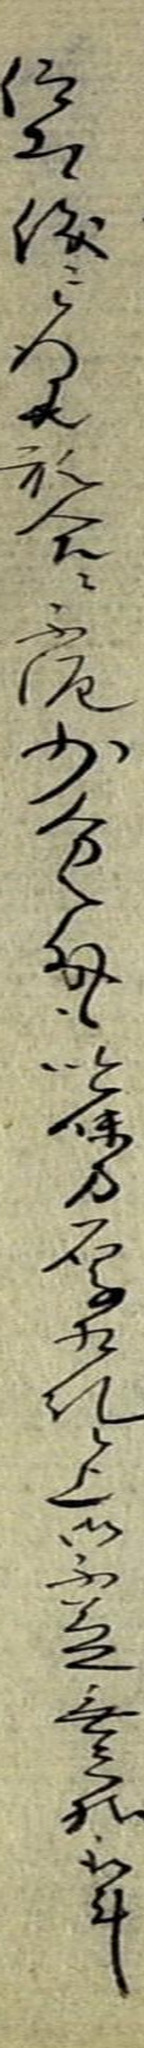仰出候儀に候得共形合に不泥少分之義も吟味方厚相糺候上御不益無之様取斗
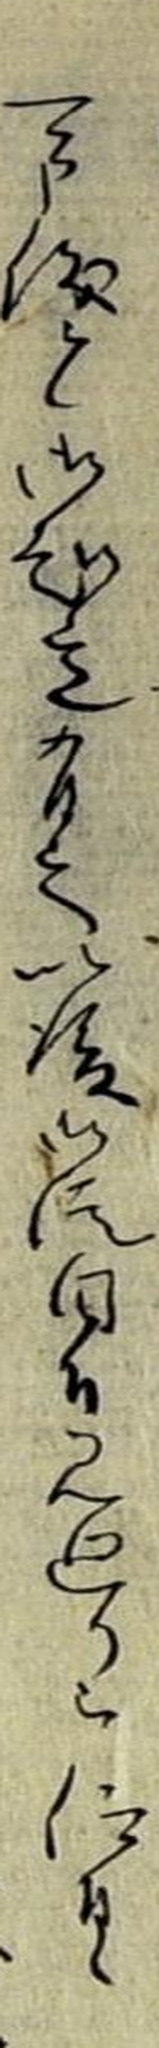可申儀と御趣意有之以後御徒目付見廻り被仰付候
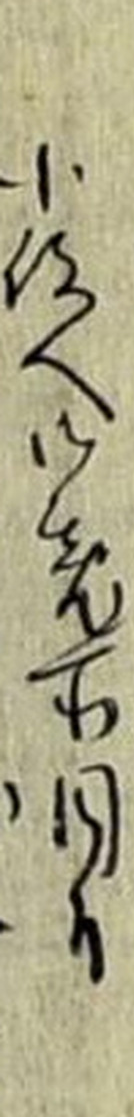小役人御台所目付
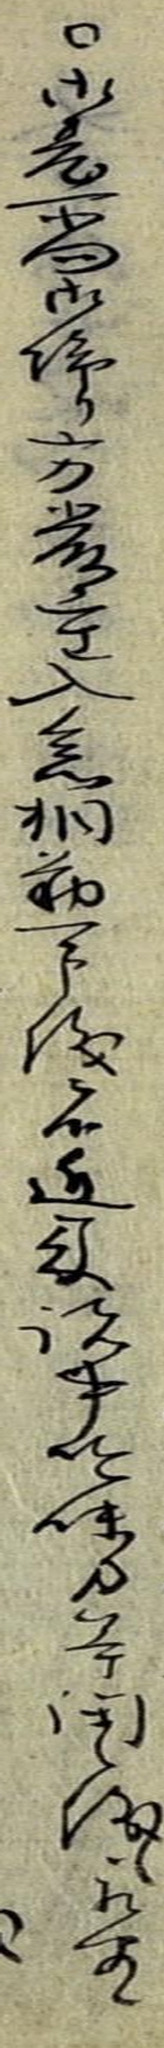○御台所向御締り方厳重入念相勤可申儀に候近来諸事吟味方等閑之儀も相聞候
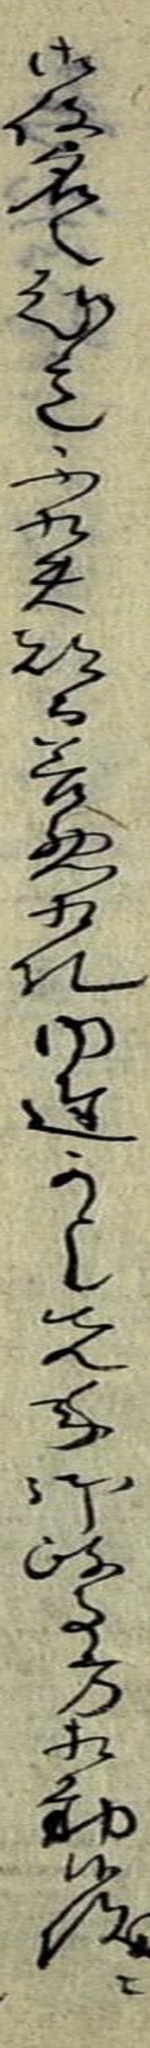御役名之趣意不相失都而善悪相糺内達可申候先年御政事方相勤候儀に
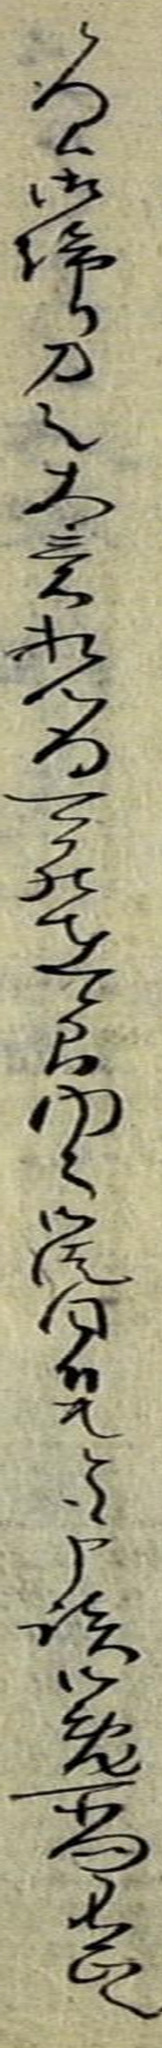候得ハ御締り方之大意相心得可罷在候間内々御徒目付共とも申談御台所向不正之
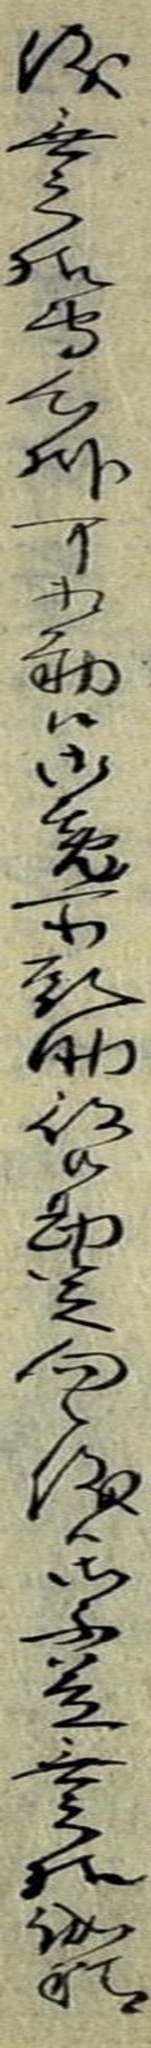儀無之様専心掛可相勤候御台所頭助役御勘定向之儀は御不益無之様誠精
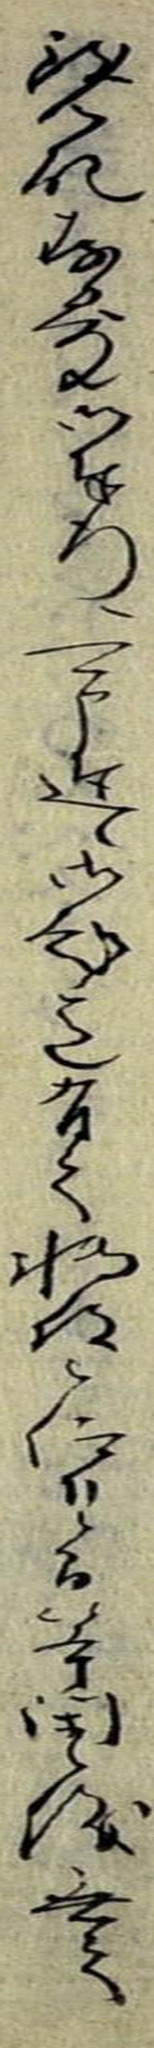致心配存寄共御奉行へ可申達候御趣意有之転役被仰付候間等閑之儀無之
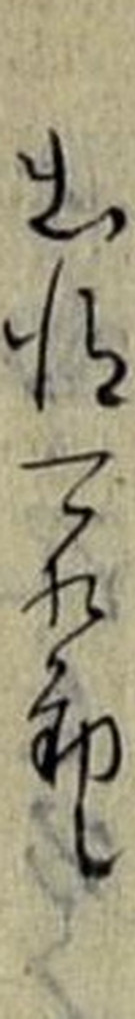出精可相勤候
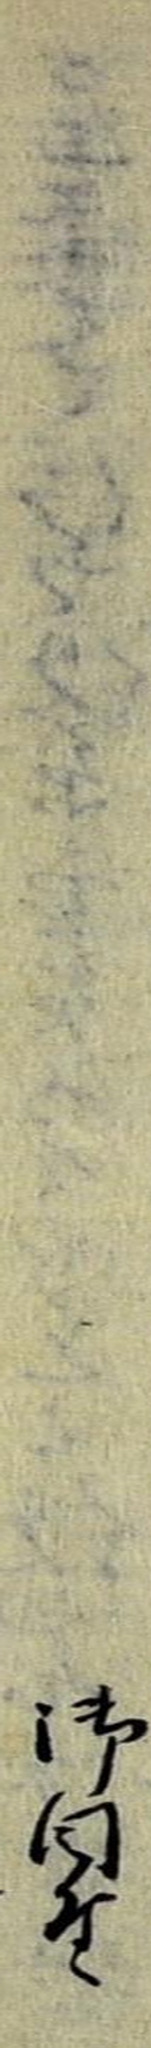御目付へ
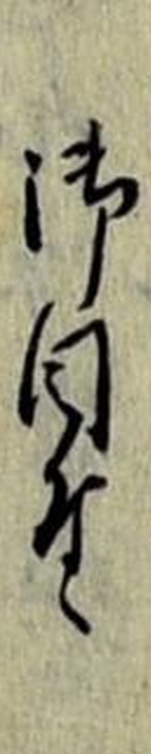御目付へ
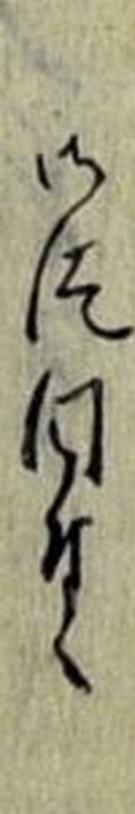御徒目付へ
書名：命令之部 四
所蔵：福井県文書館 Fukui Prefectural Archives
